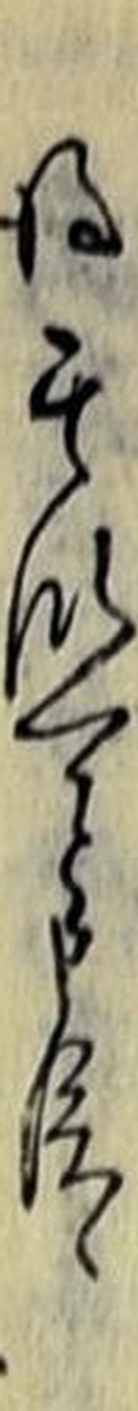得其段可被申渡候
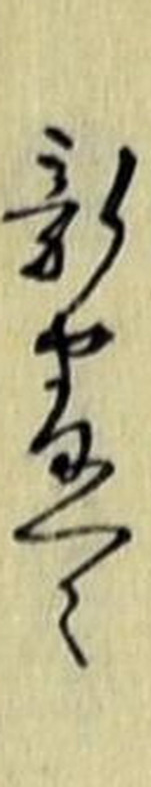新番一々
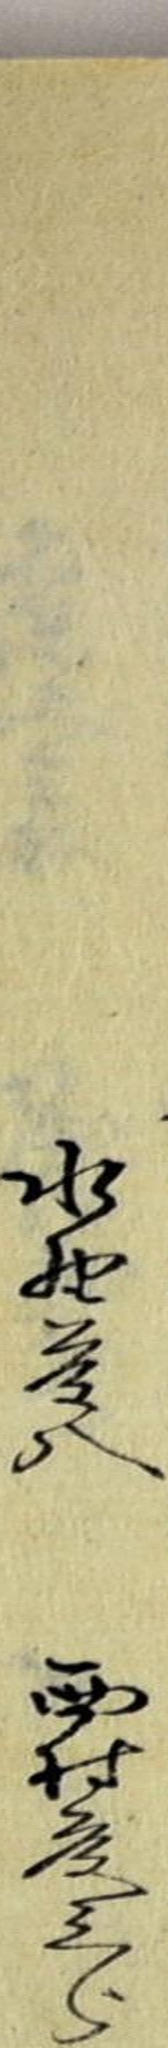水野藤八西村藤三郎
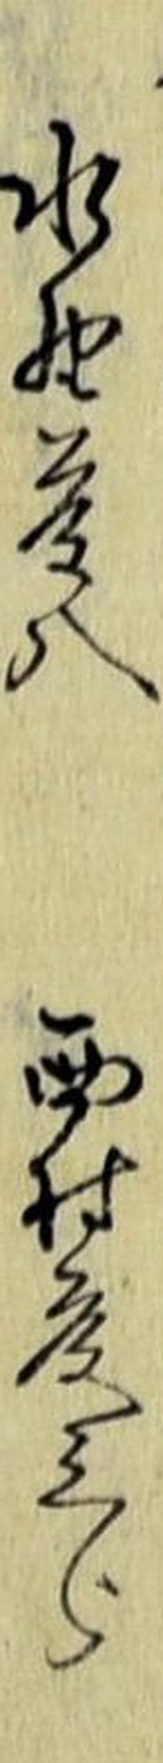水野藤八西村藤三郎
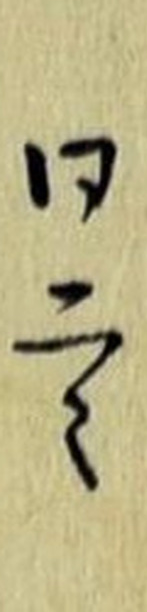同二々
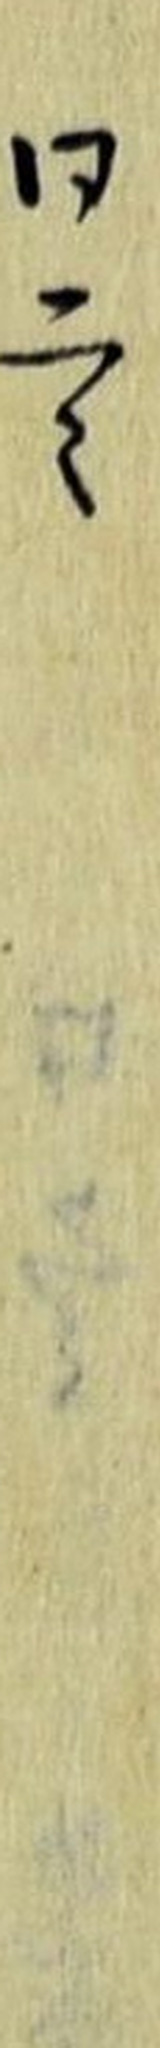同二々
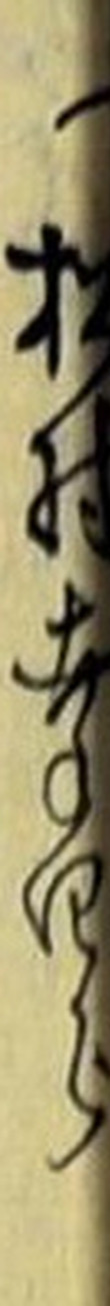松村幸四郎
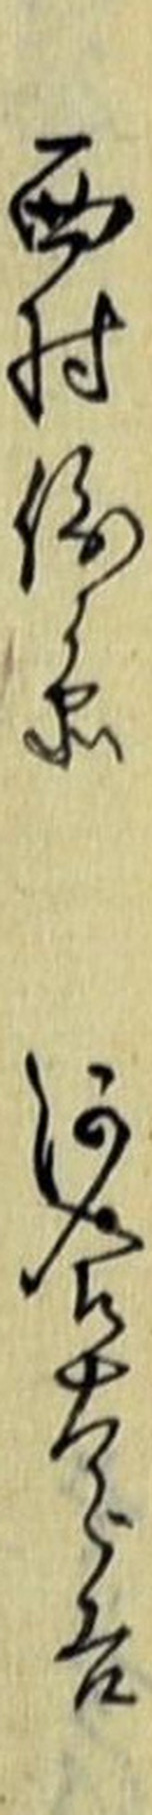西村儀兵衛河合太郎吉
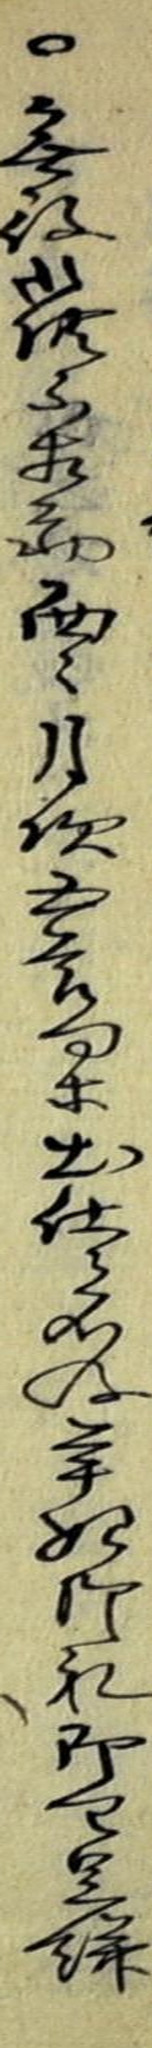○無役御供不相勤面々月次五節句等出仕に不及年始御礼御具足餅
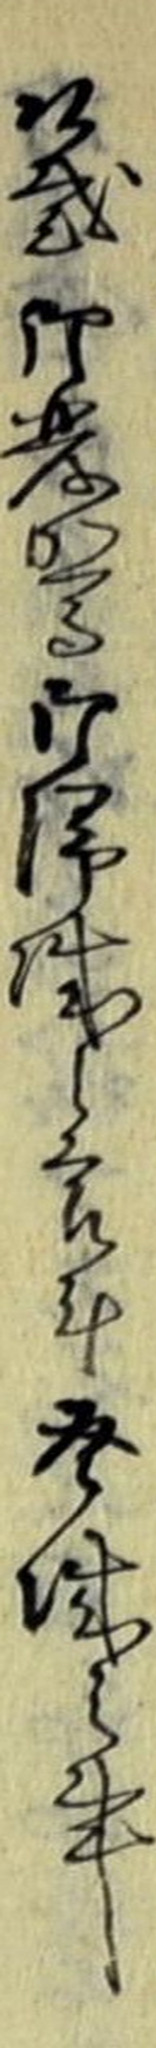頂戴御発駕御帰城之節斗登城之事
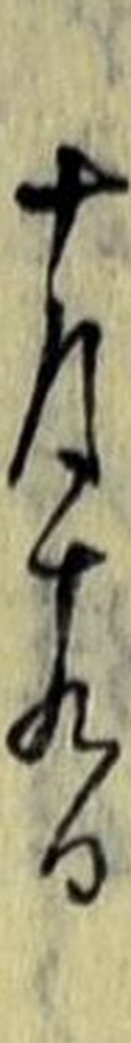十月十九日
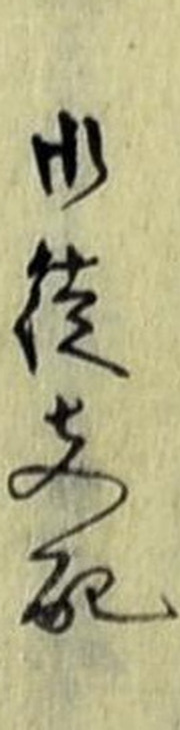御徒支配
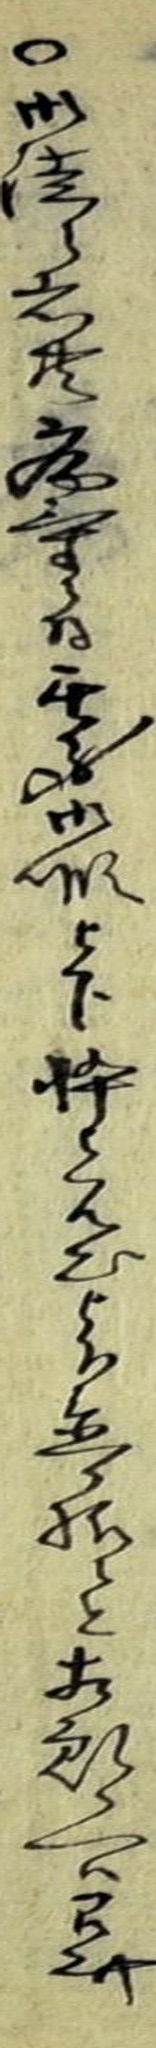○御徒之者共病気に付其身御暇被下忰被召出被下置候様にと相願候へは即刻
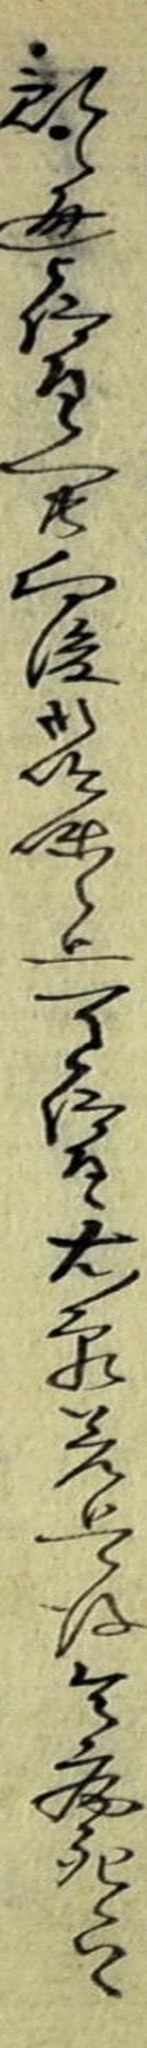願之通被仰付候へ共向後御吟味之上可被仰付候右願差上候後令病死候はヽ
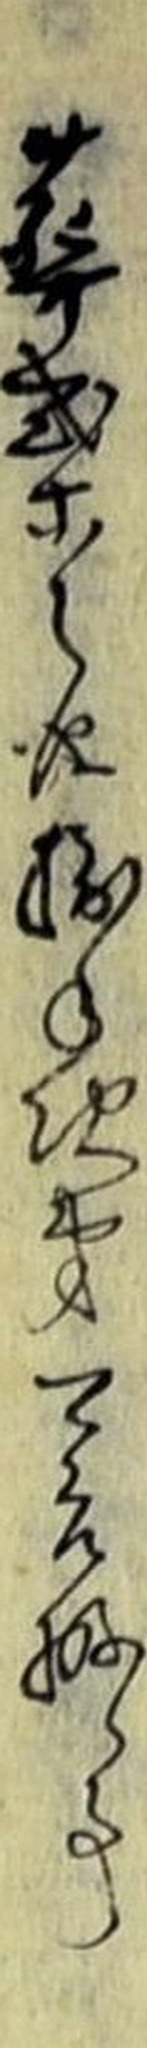葬式等之儀勝手次第可取扱候事
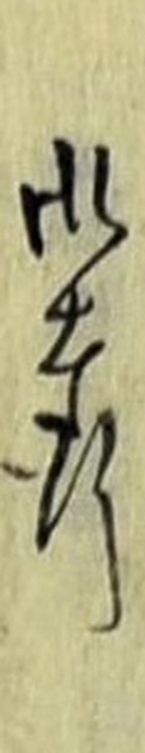御奉行
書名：命令之部 四
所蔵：福井県文書館 Fukui Prefectural Archives
